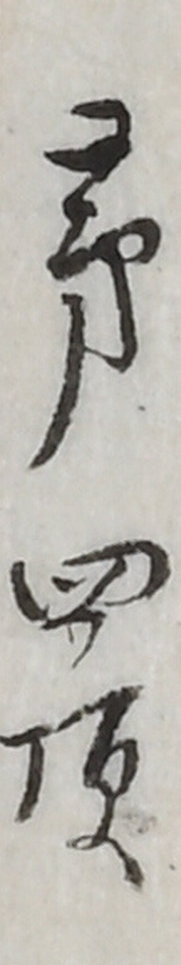第四項
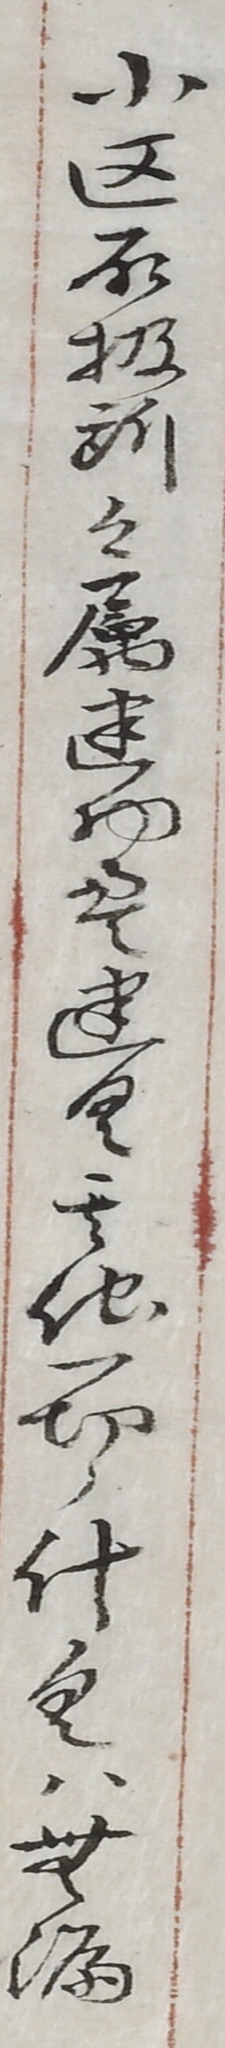小区取扱所々属建物は建具其外一切ノ什具ハ無漏
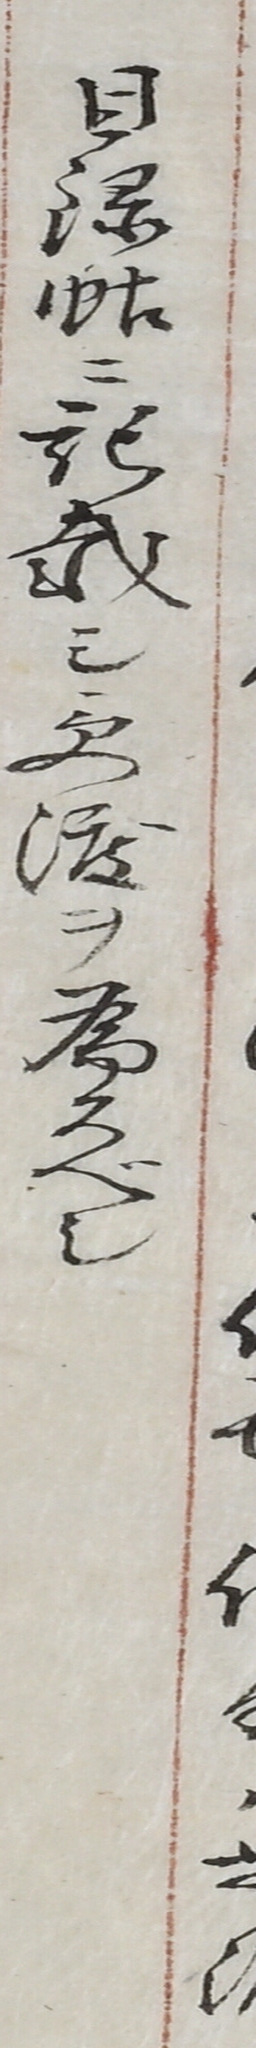目録帳ニ記載シ受渡ヲ為スべシ
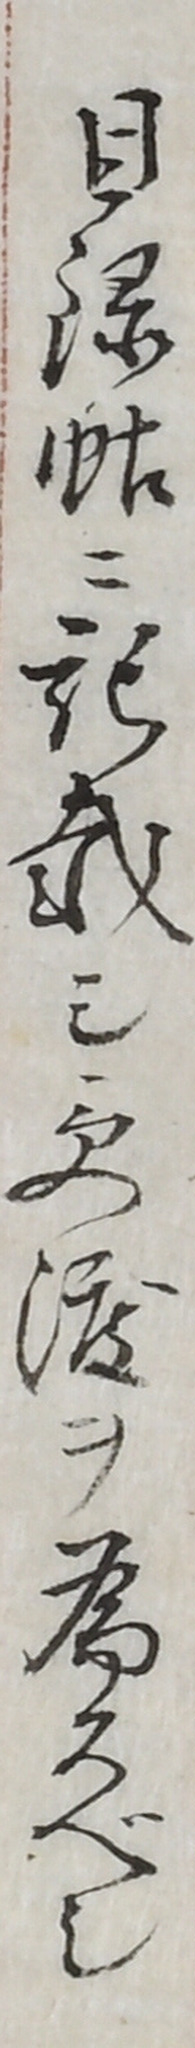目録帳ニ記載シ受渡ヲ為スべシ
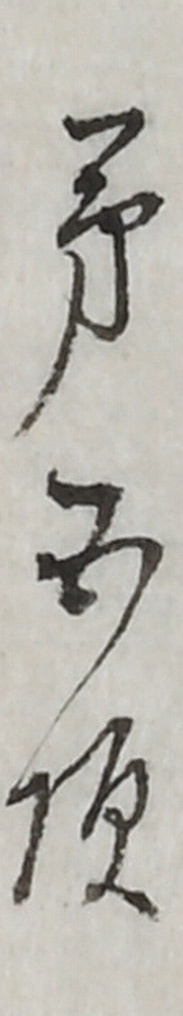第五項
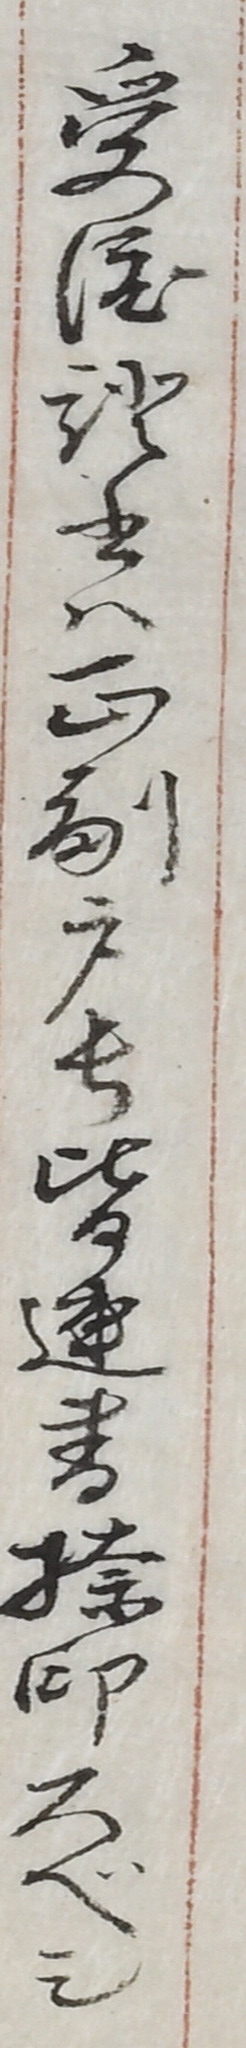受渡証書ハ正副戸長皆連書捺印スベシ
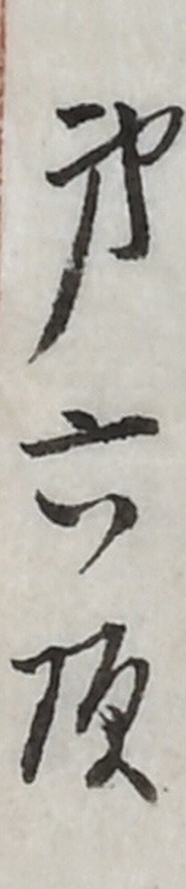第六項
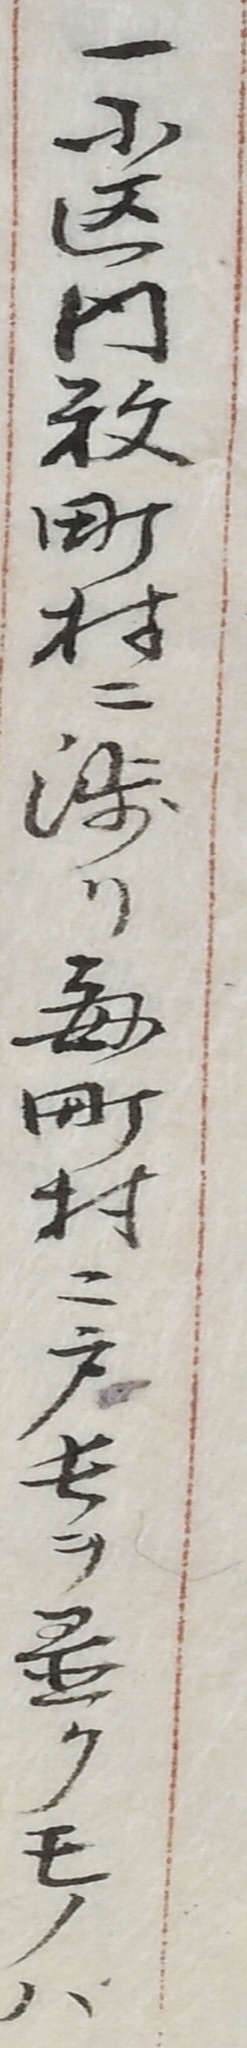一小区内数町村ニ渉リ毎町村ニ戸長ヲ置クモノハ
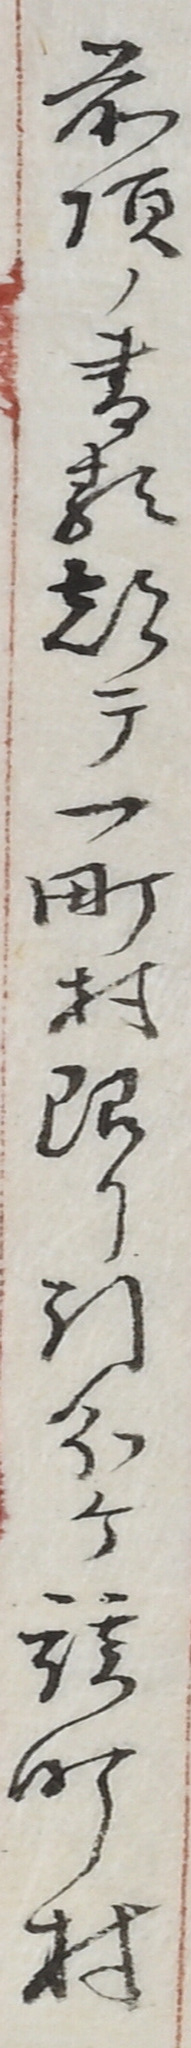前頂ノ書類都テ一町村限り引分ケ該町村

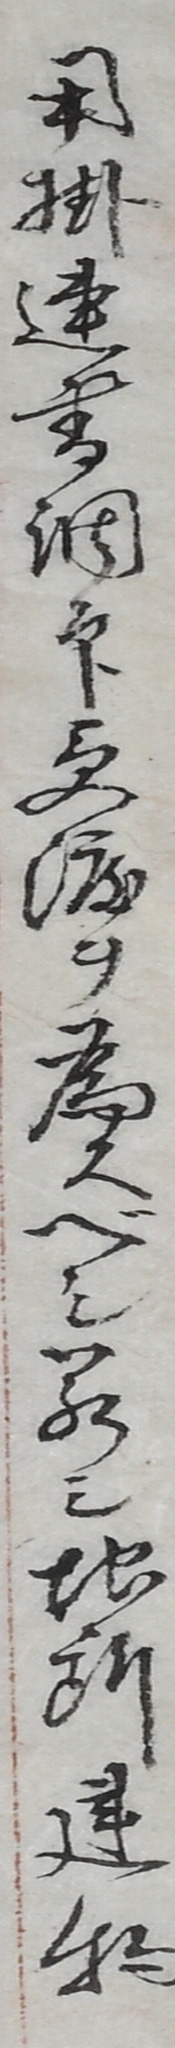用掛達書調印受渡ヲ為スべシ若シ地所建物
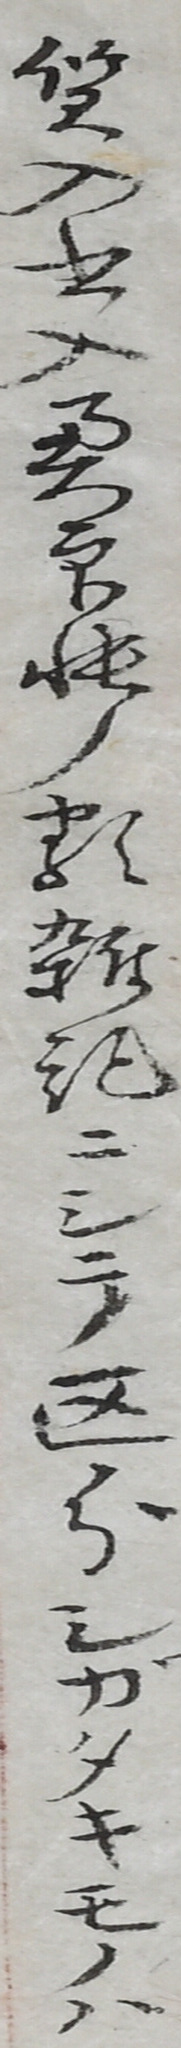質入書入奥印帳ノ類雑記ニシテ区分シガタキモノハ
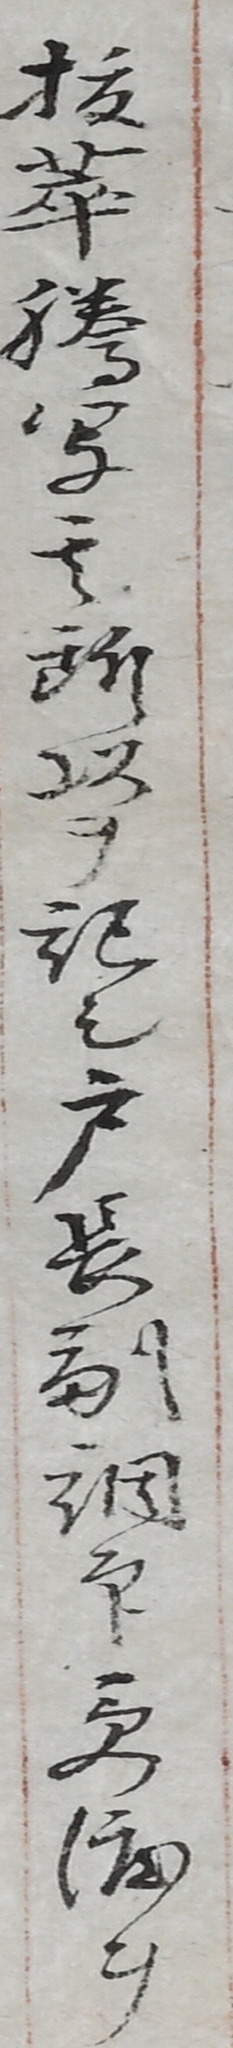抜萃騰写其所以テ記シ戸長副調印受渡ヲ
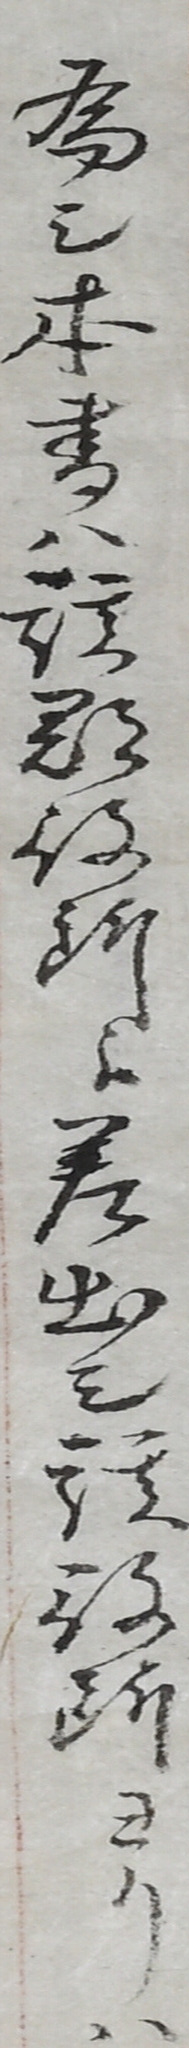為シ本書ハ該郡役所江差出シ該役所ヨリハ
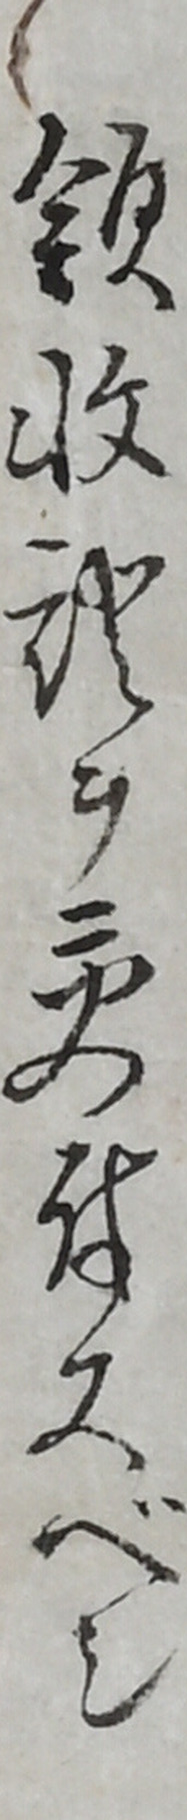領収證ヲ交付スべシ
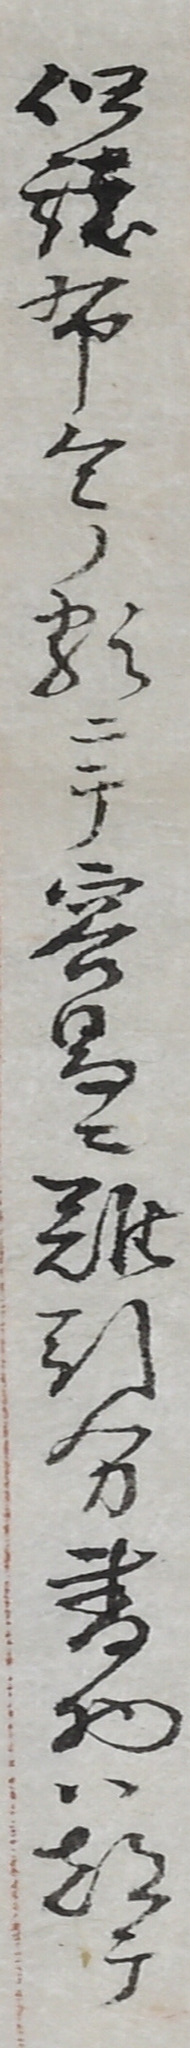但諸布令ノ類ニテ容易ニ難引分書物ハ都テ
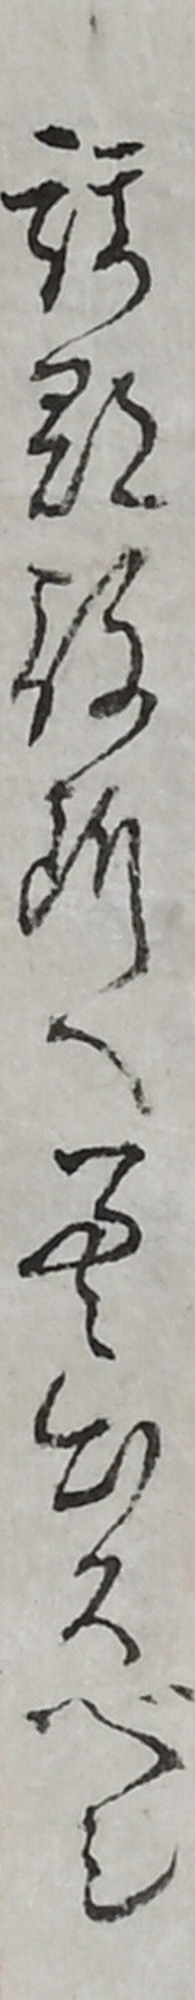該郡役所へ差出スべシ
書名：郡役所勤務中御用抜書
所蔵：伊那市立高遠町図書館・合同会社AMANE
